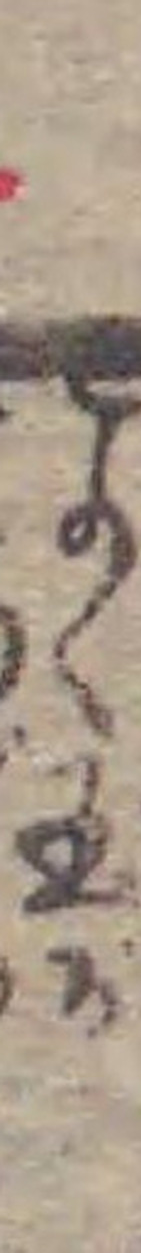よく玉が
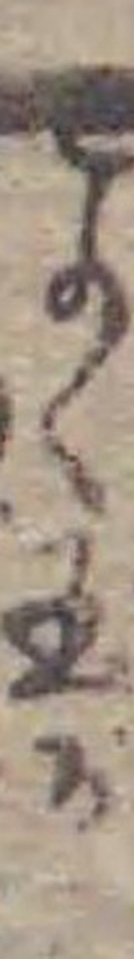よく玉が
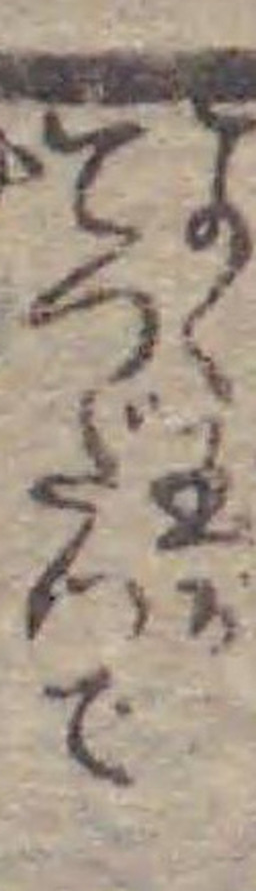たつだつて

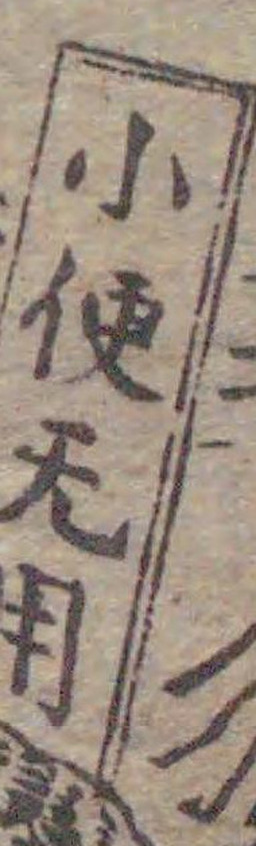小便無用
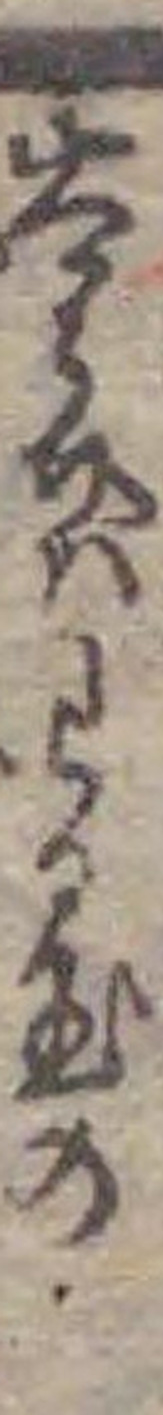太郎介はわる玉の
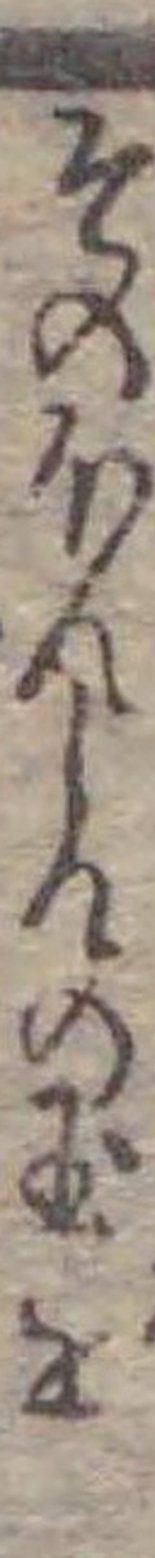そのほんしんの玉を
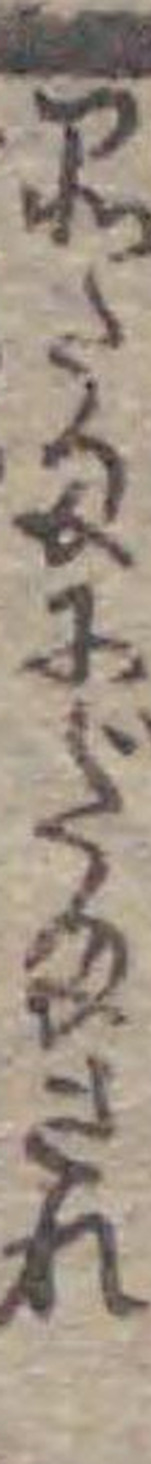品たまにだまされ
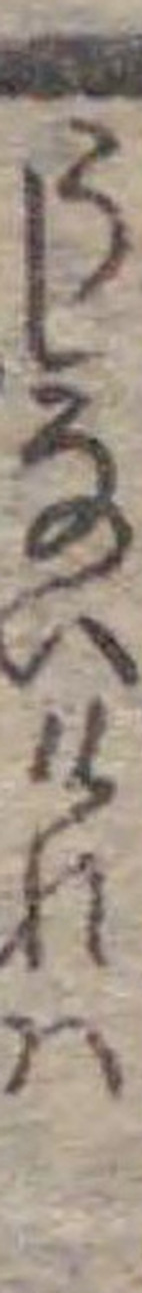うしないけれは
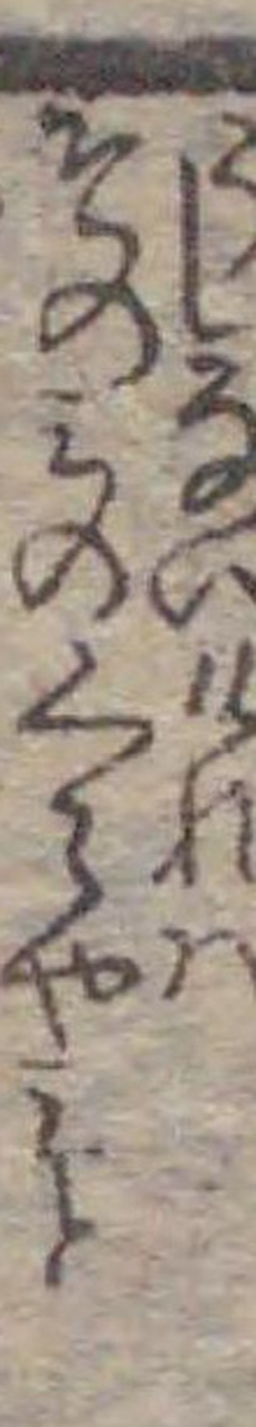そのみのくらやみと
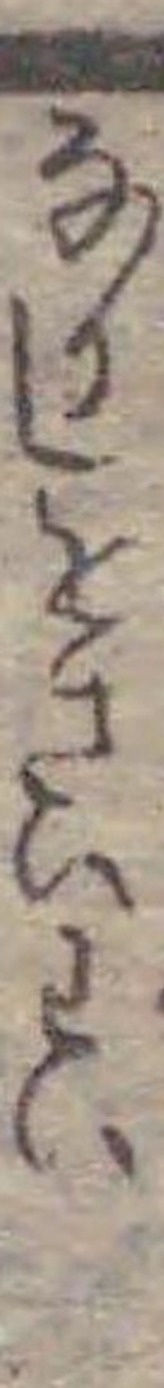なりしをさいわい
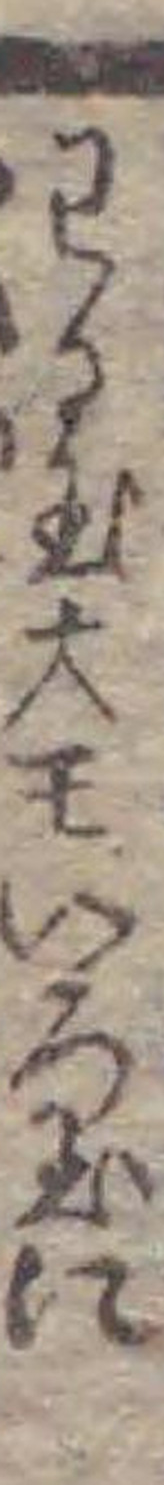わる玉大王いろ玉に
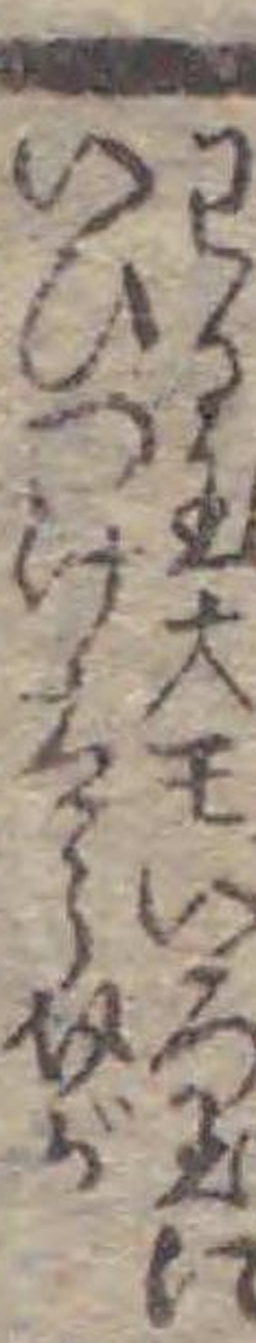いひつけ太郎介が
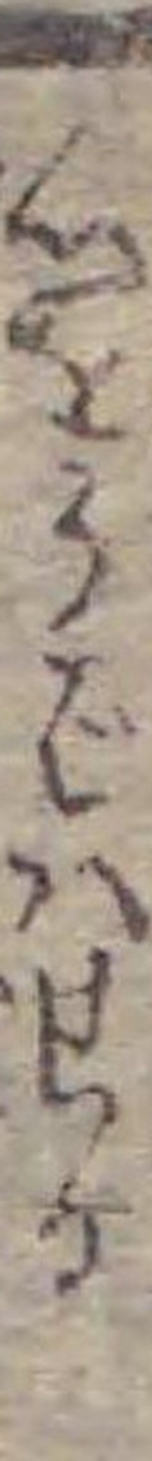心をうばはせる
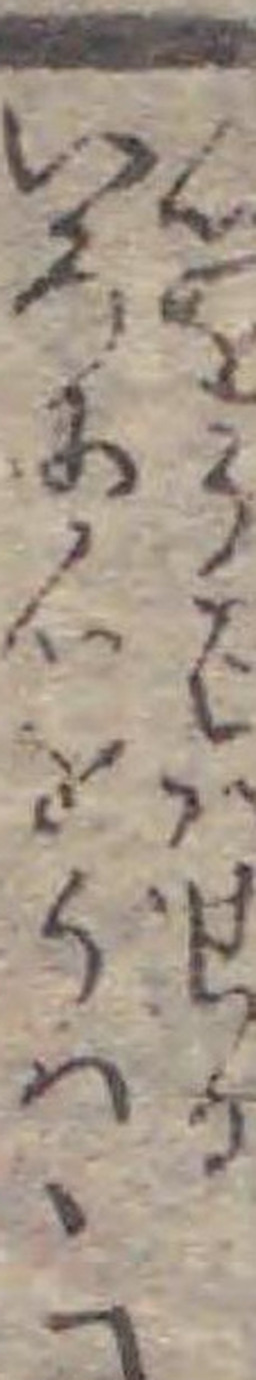いろに心をうばゝ
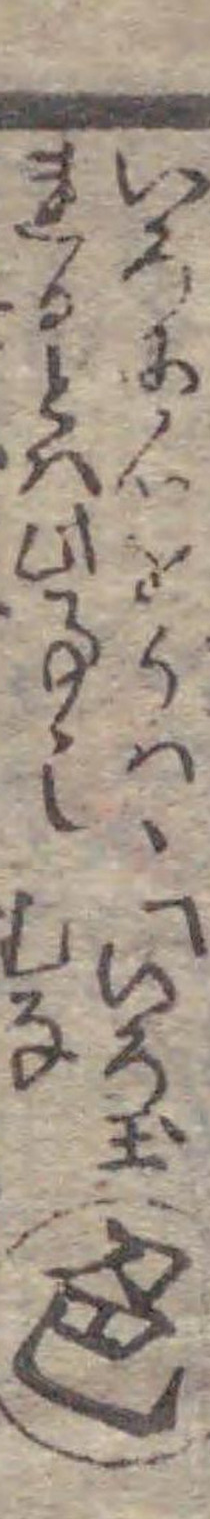れるとは此事也
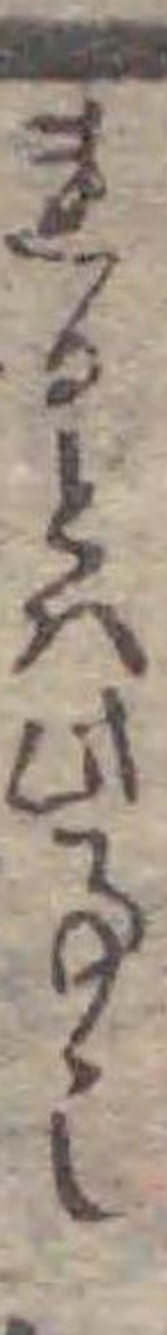れるとは此事也
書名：四遍搨心学草帋 : 3巻
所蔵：国立国会図書館 National Diet Library, JAPAN
